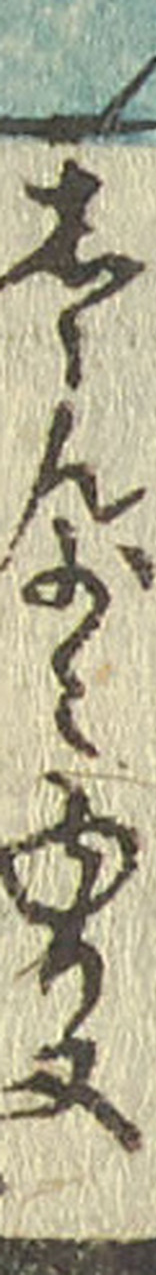ししん少〻ゆり又
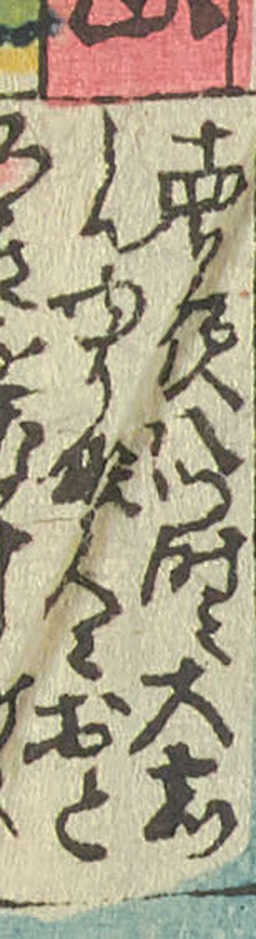しんゆり始人〻おと
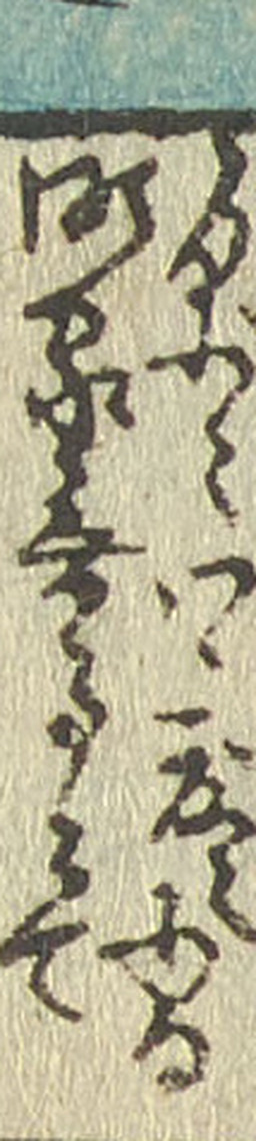町家無事ニて
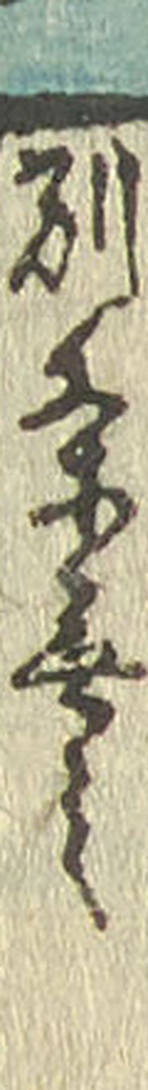別条無之
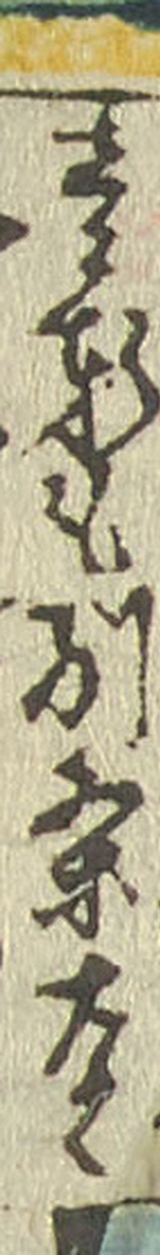壱軒も別条なく
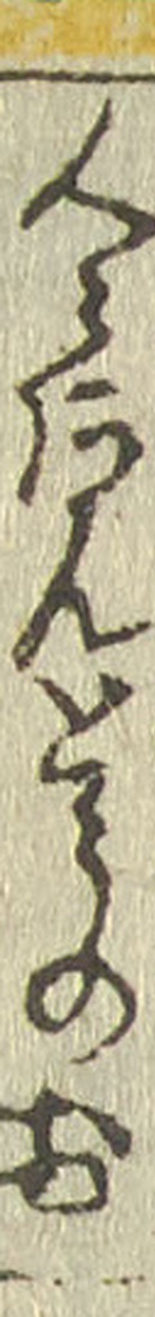人〻あんとうのお
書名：大地震早引方角附
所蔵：東京大学総合図書館 General Library in the University of Tokyo, JAPAN
